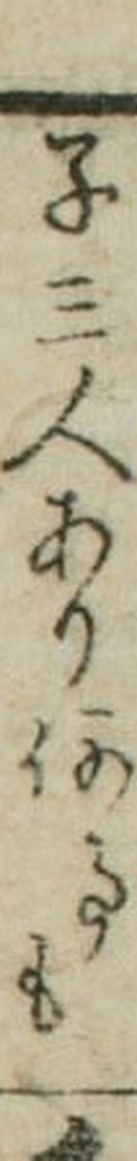子三人あり何事も
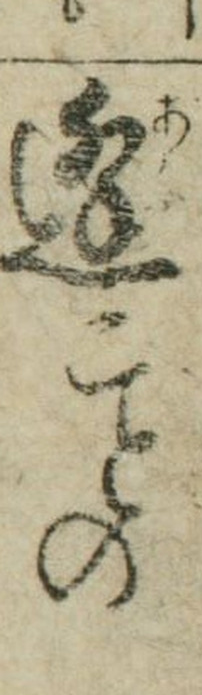逢ことの
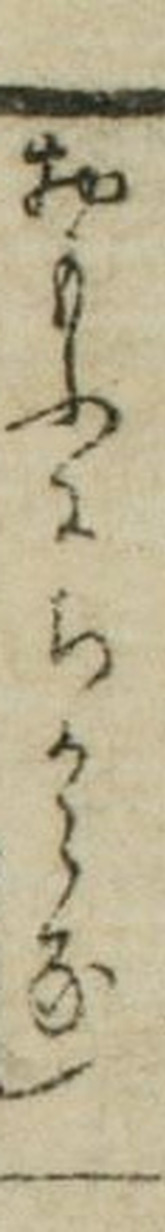おもふにちからなし
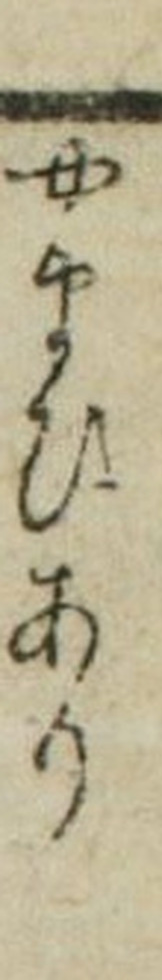やまひあり
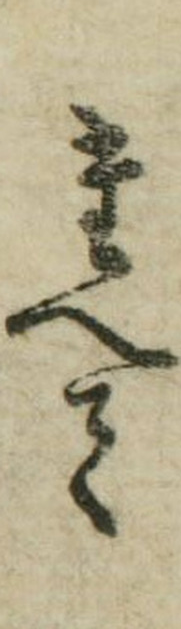たへて
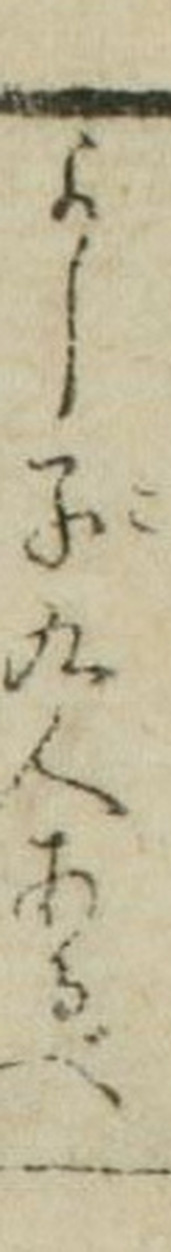よし子九人あるべし
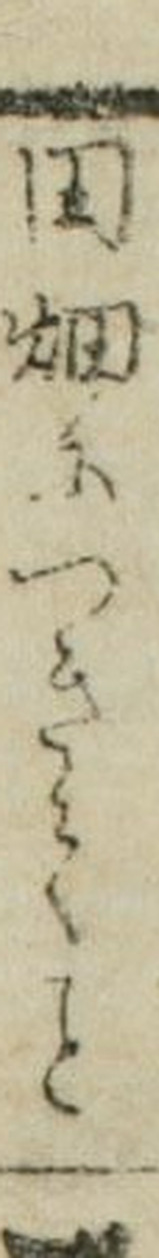田畑につきてこと
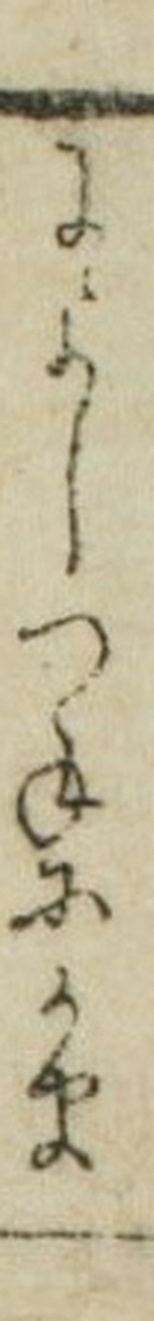によしつねにかま
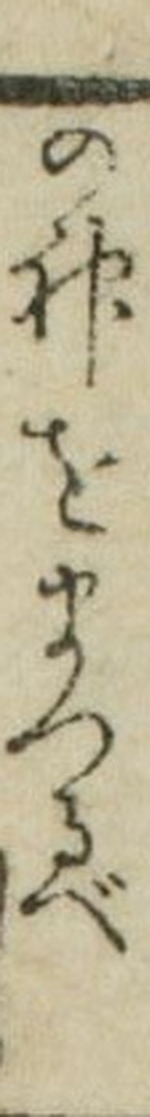の神をまつるべし
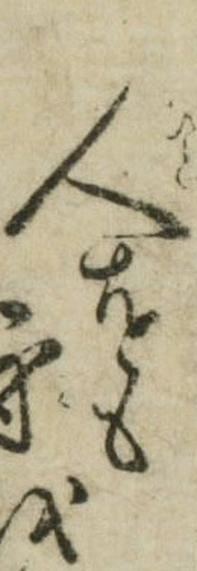人をも
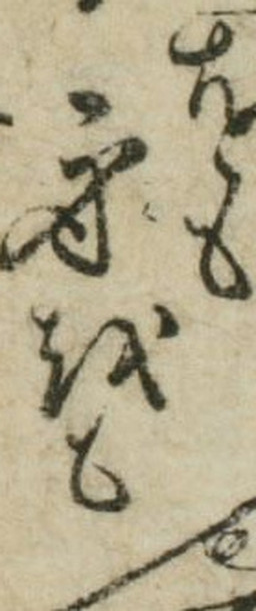身をも
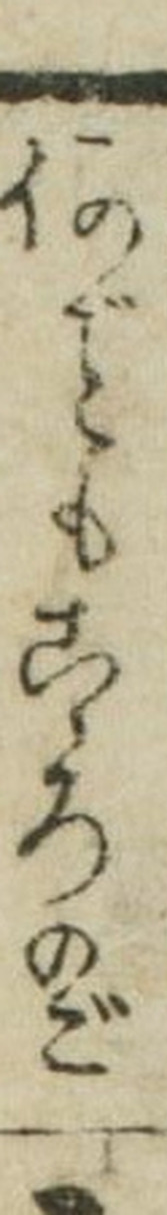何ごともこゝろのご
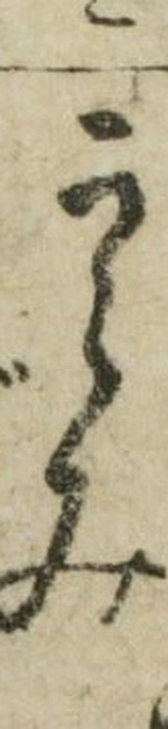うらみ
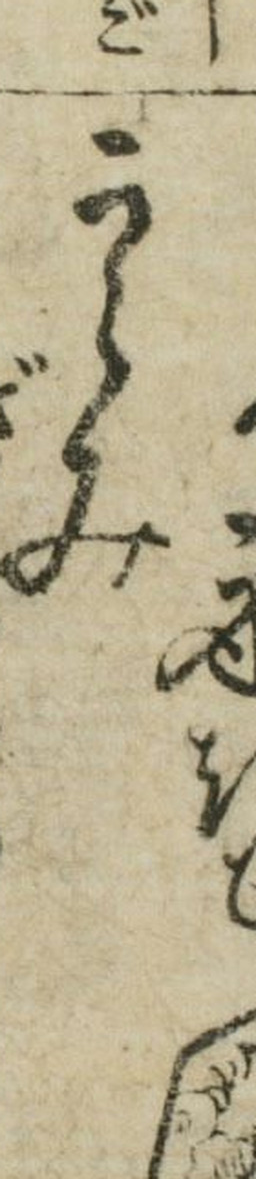うらみ
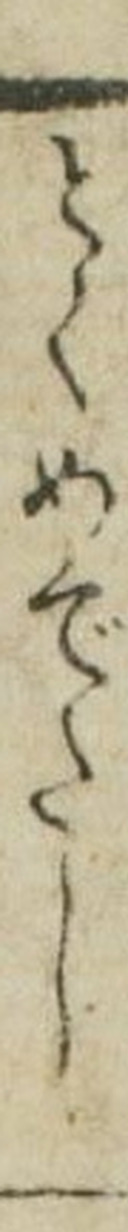とくめでたし
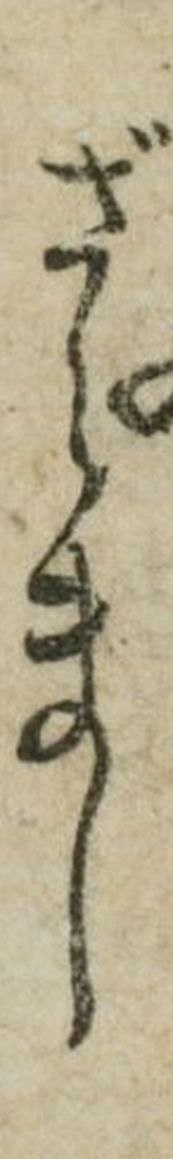ざらまし
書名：百人一首
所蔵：東京学芸大学教育コンテンツアーカイブ
